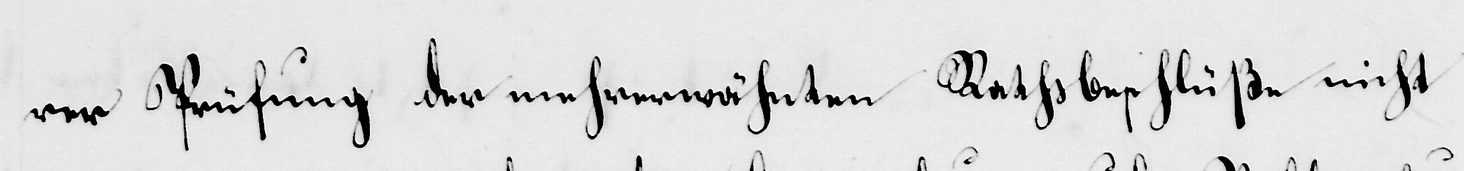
rer Prüfung der mehrerwähnten Rathsbeschlüße nicht
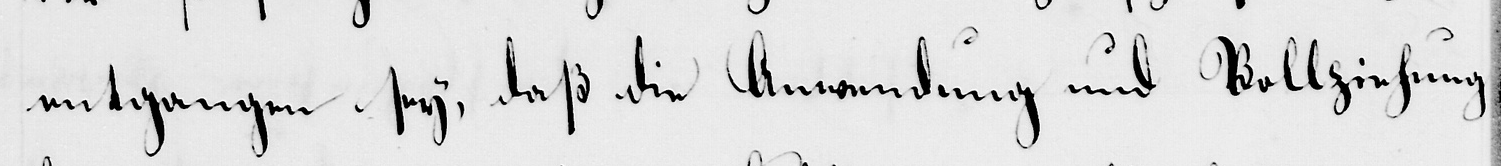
entgangen sey, daß die Anwendung und Vollziehung
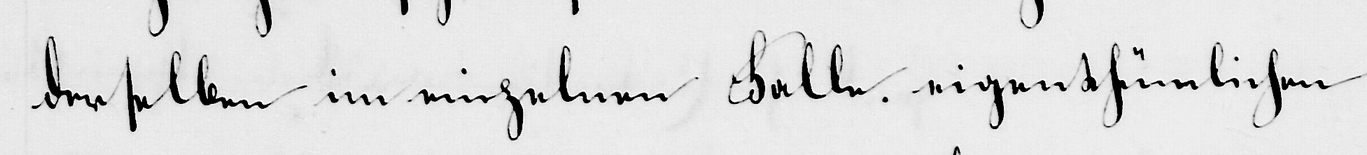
derselben im einzelnen Falle eigenthümlichen
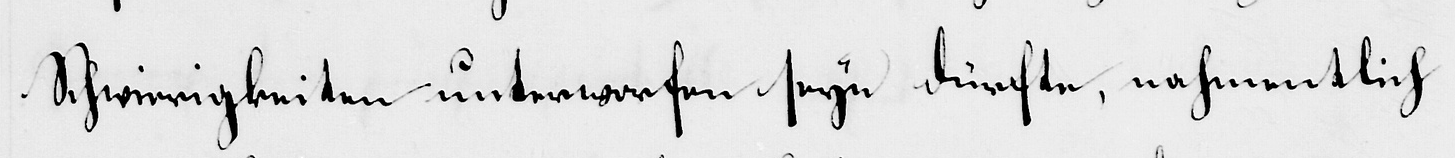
Schwierigkeiten unterworfen seyn dürfte, nahmentlich
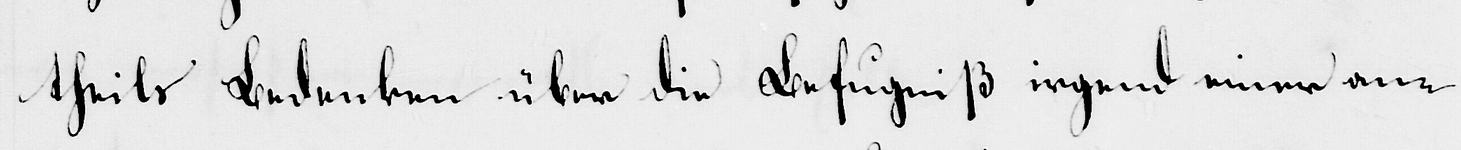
theils Bedenken über die Befugniß irgend einer an¬
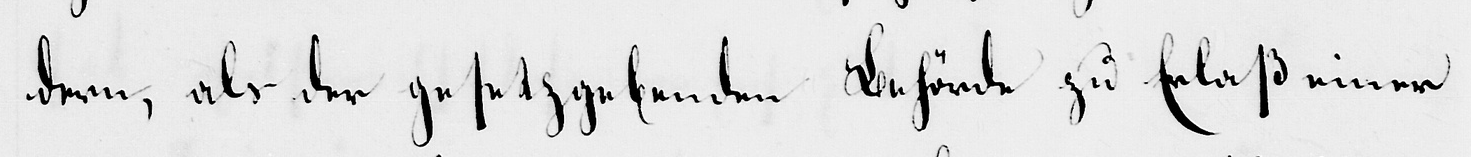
dern, als der gesetzgebenden Behörde zu Erlaß einer
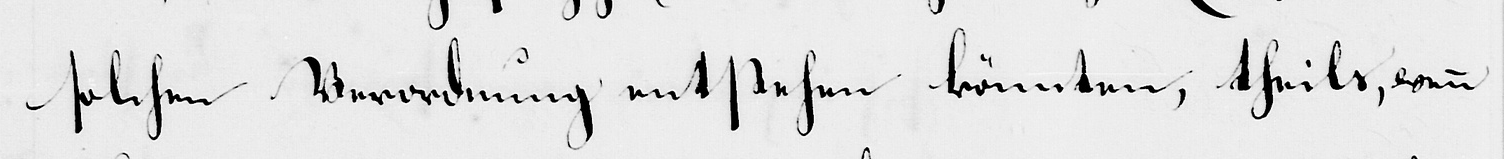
solchen Verordnung entstehen könnten, theils, wenn
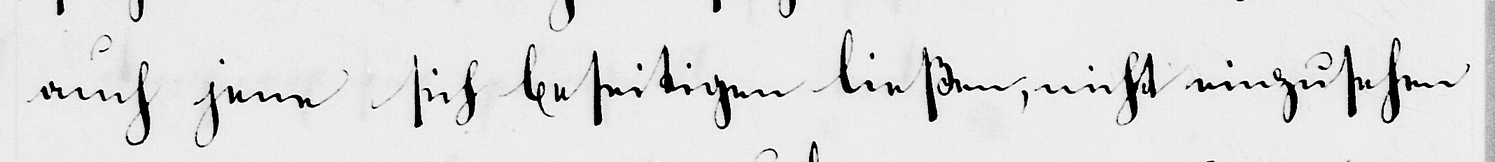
auch jene sich beseitigen ließen, nicht einzusehen
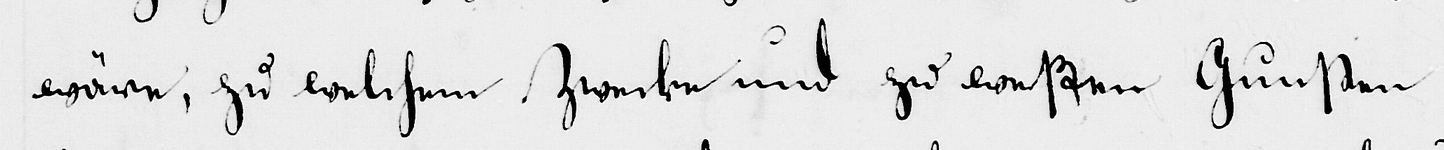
wäre, zu welchen Zwecke und zu weßen Gunsten
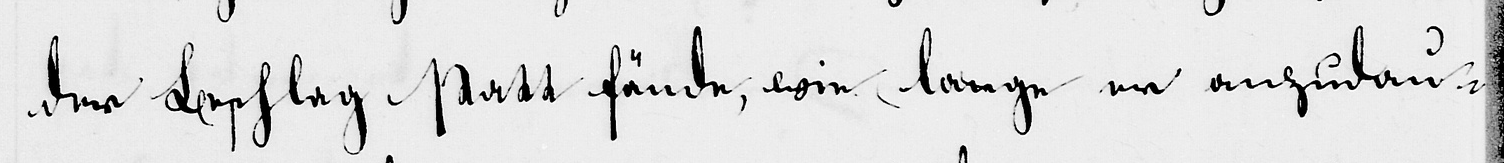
der Beschlag statt fände, wie lange er anzudau¬
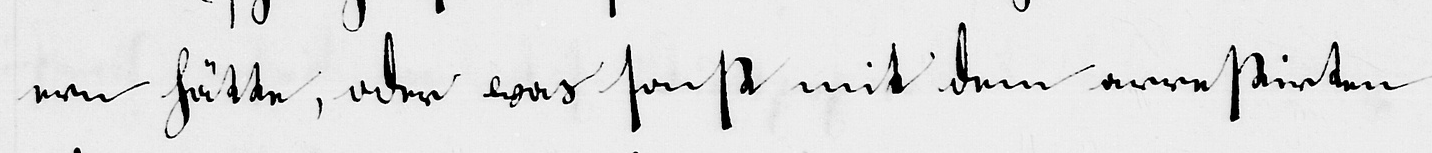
ern hätte, oder was sonst mit dem arrestirten
